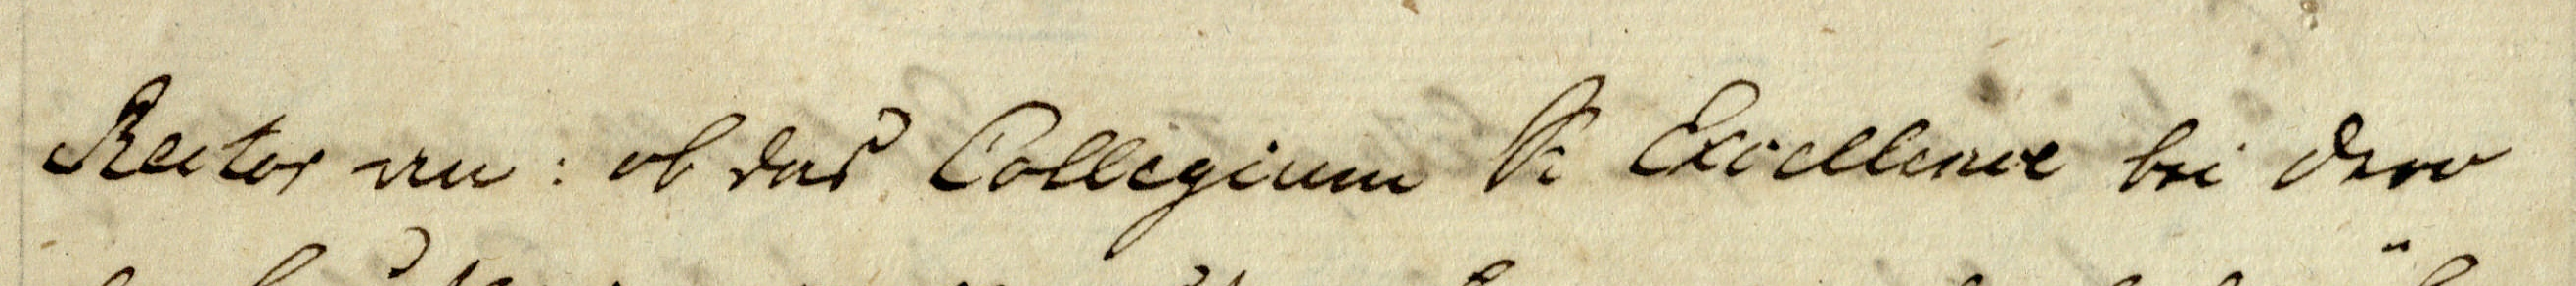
Rector an: ob das Collegium Sr Excellence bei der
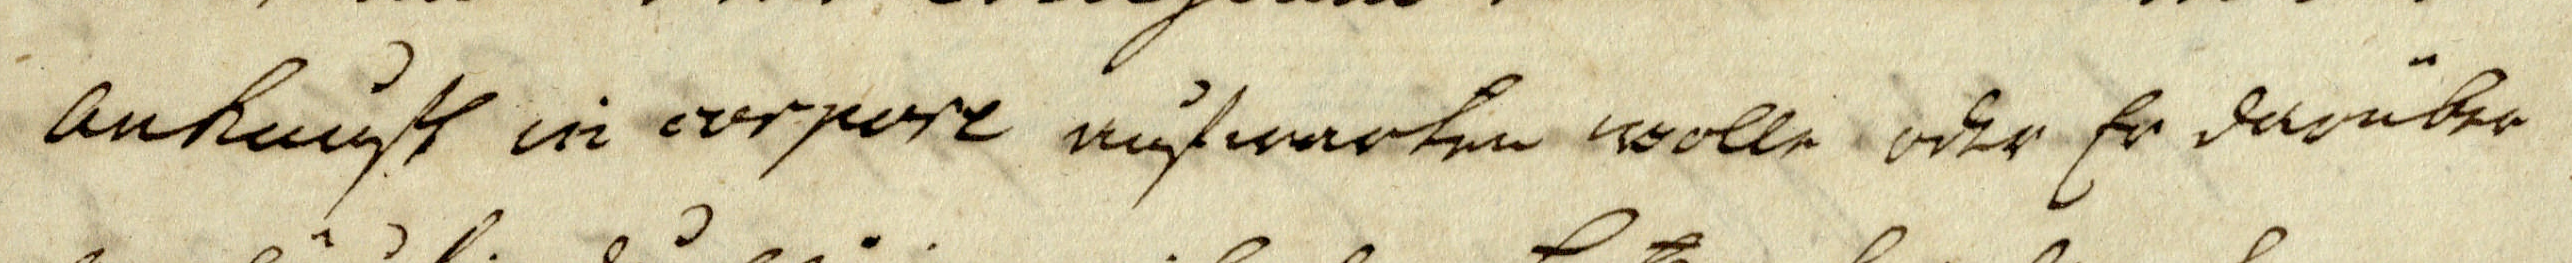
Ankunft in corpore aufwarten wolle oder Er darüber
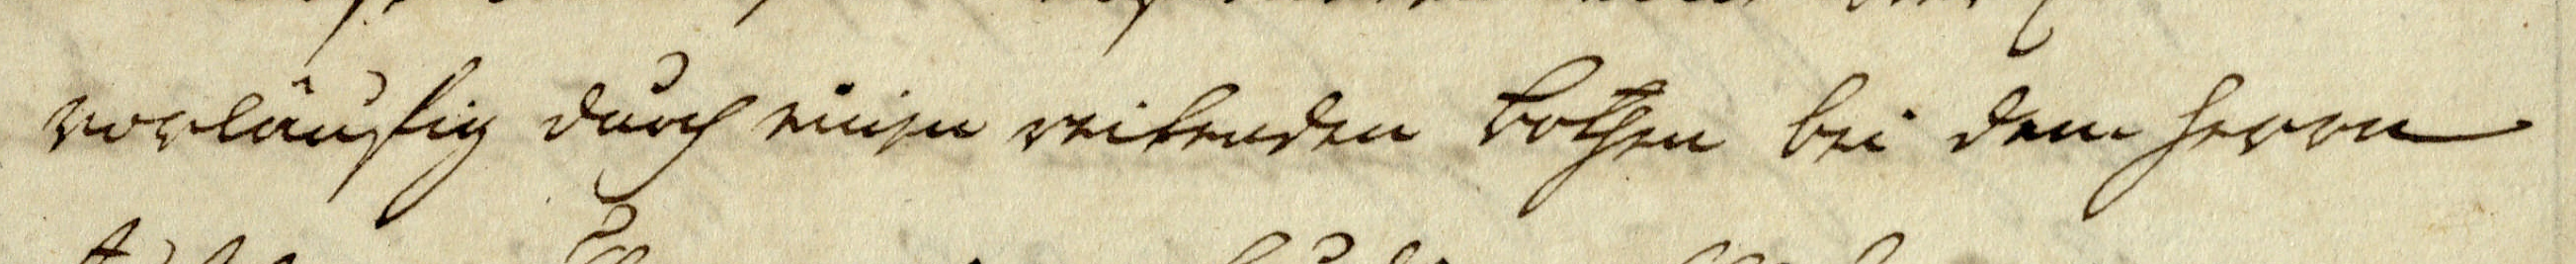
vorläufig durch einen reitenden Bothen bei dem Herrn
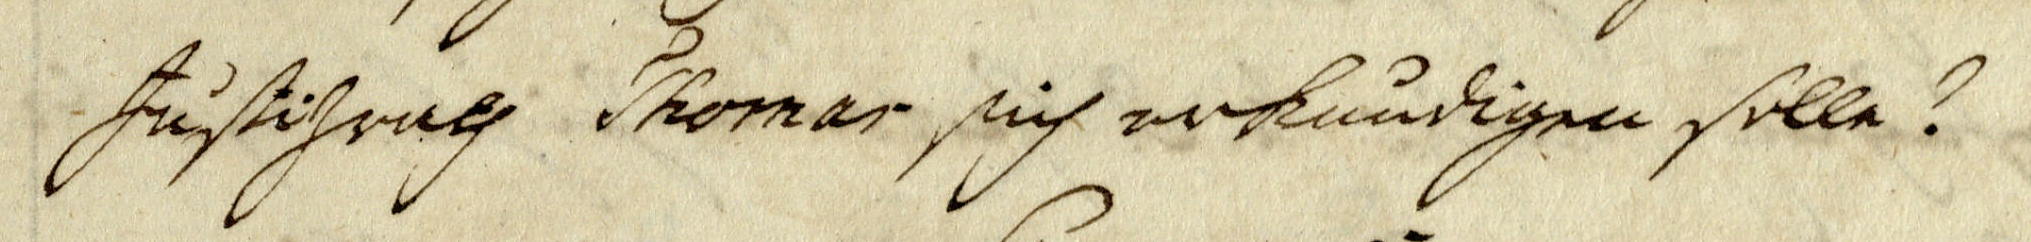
Justizrath Thomas sich erkundigen solle?
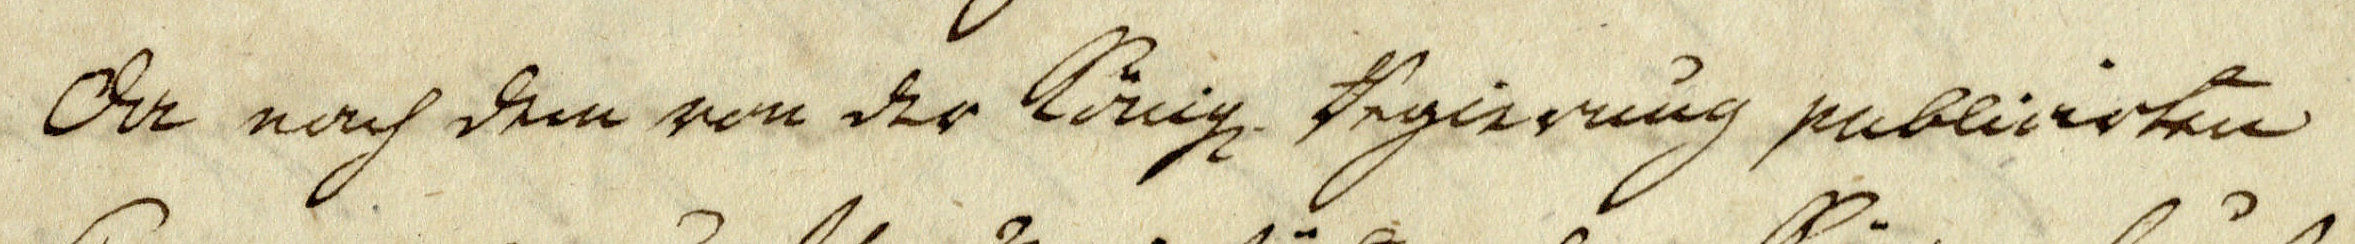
Da nach dem von der Königl. Regierung publicirten
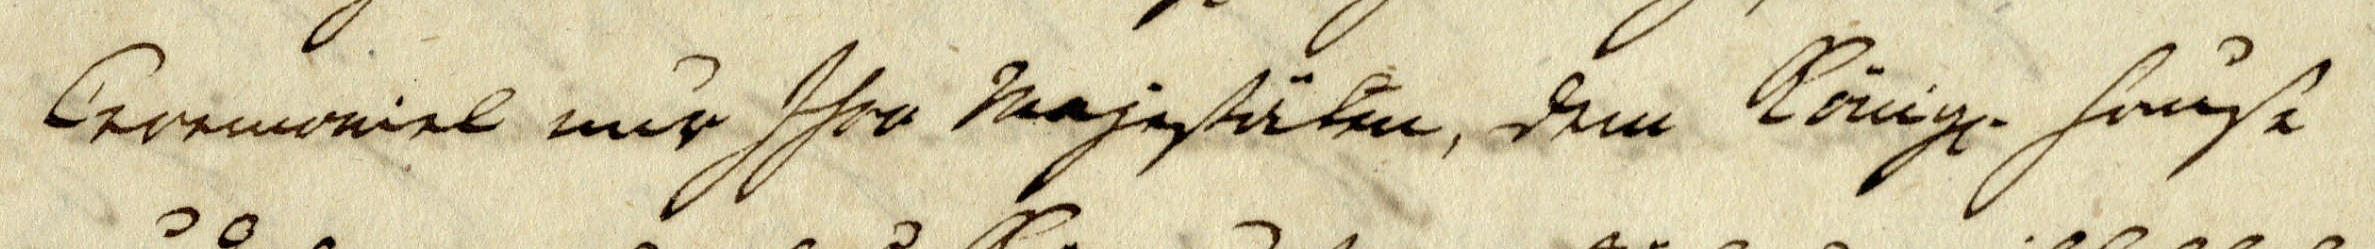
Ceremoniel nur Ihro Majestäten, dem König. Hause
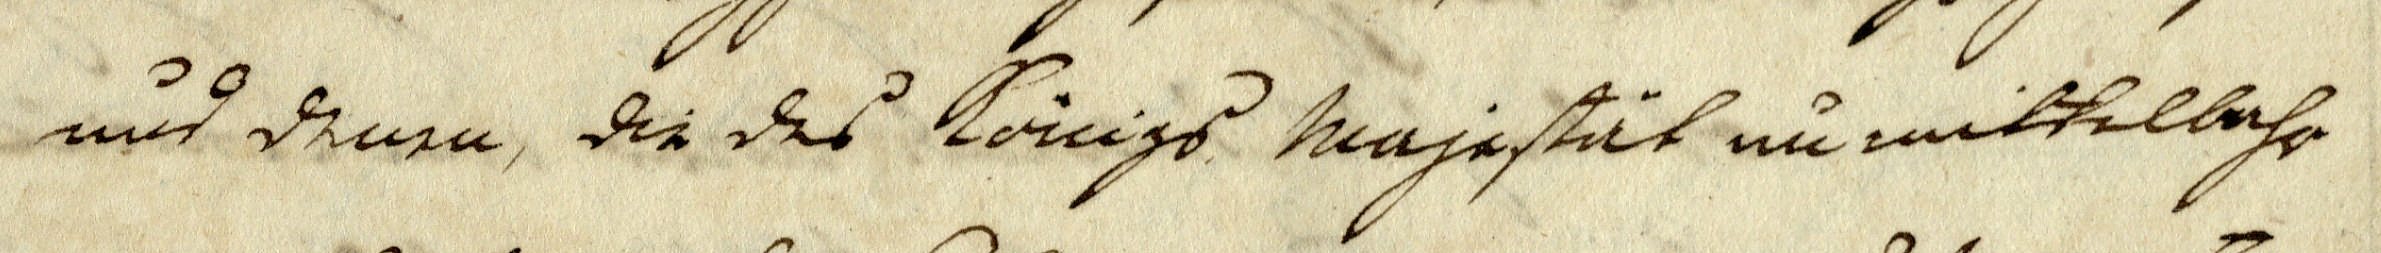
und denen, die des Königs Majestät unmittelbahr
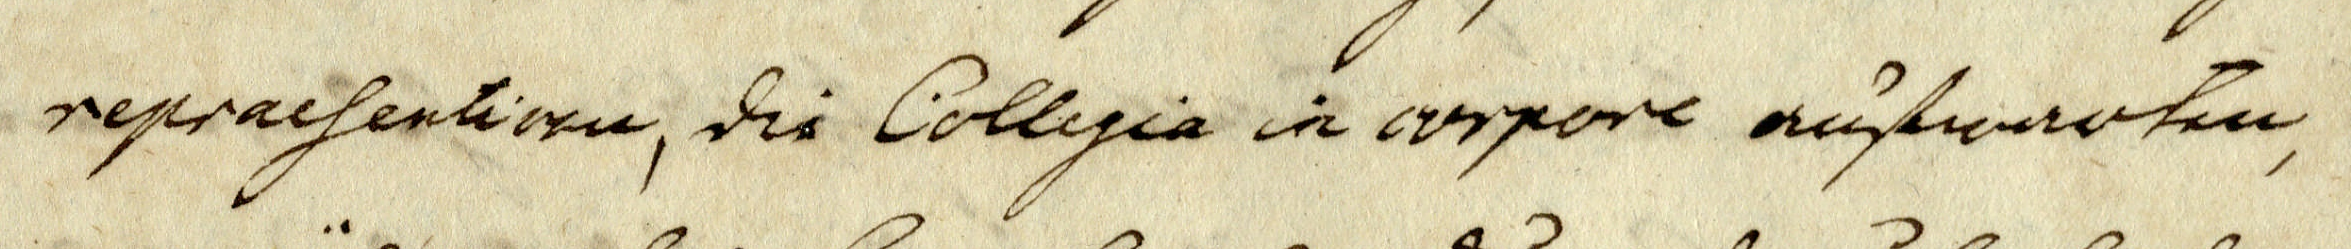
repraesentiren, die Collegia in corpore aufwarten,
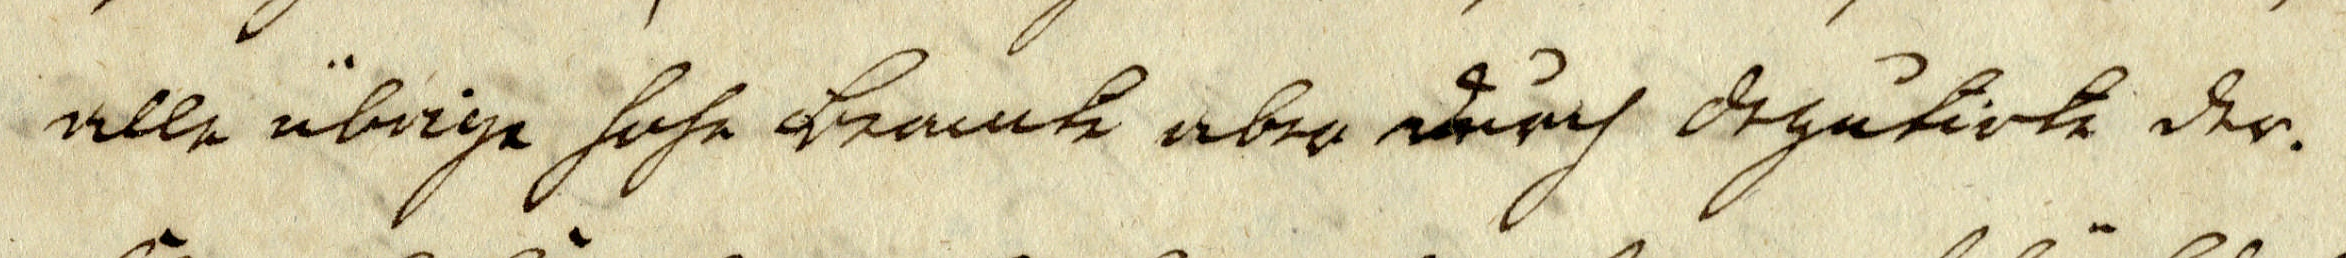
alle übrige hohe Beamte aber durch Deputirte der¬
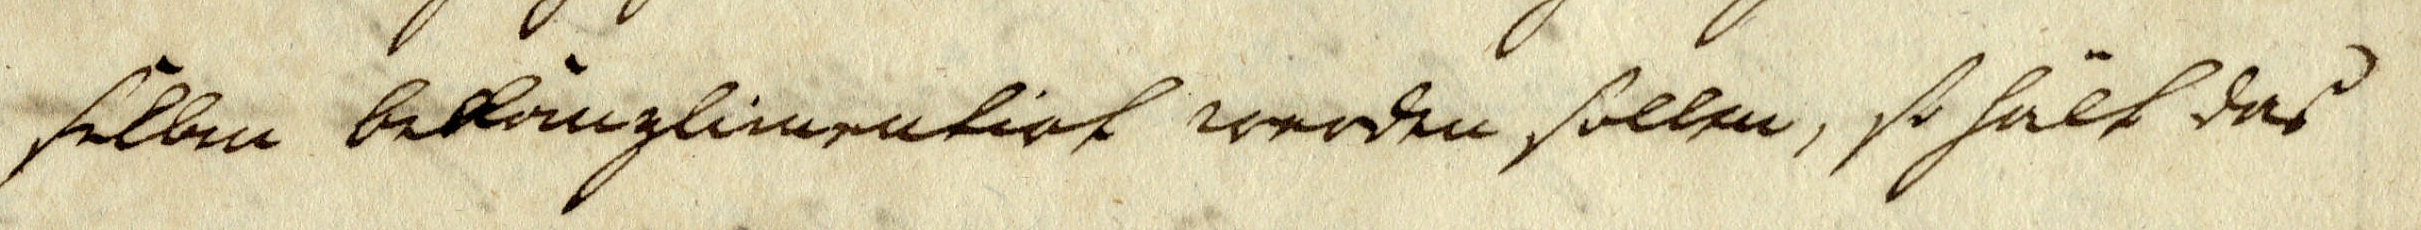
selben bekomplimentirt werden sollen, so hält das
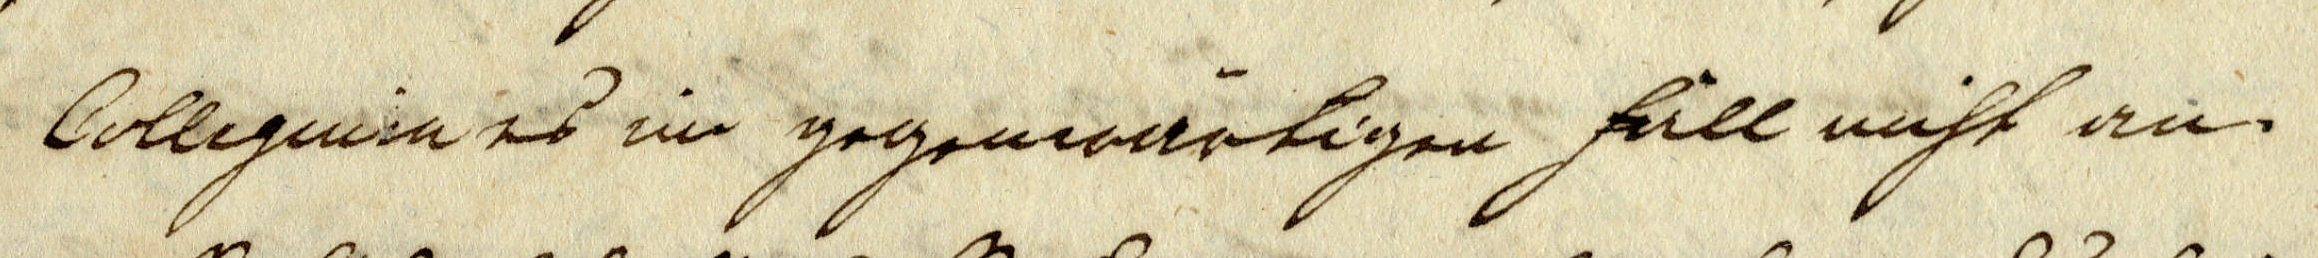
Collegium es im gegenwärtigen Fall nicht an¬
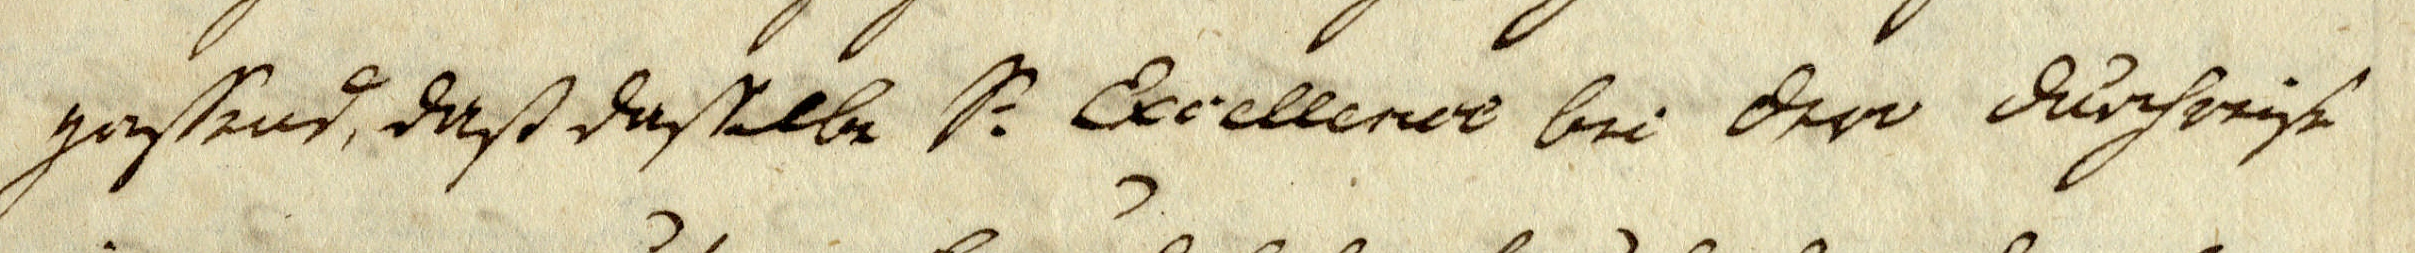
passend, daß dasselbe Sr. Excellence bei Dero Durchreise
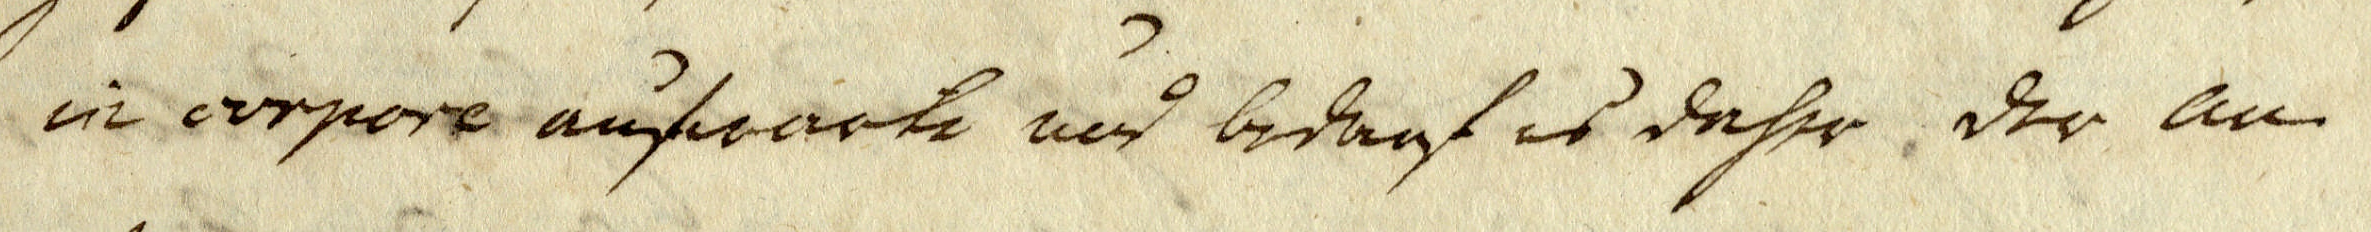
in corpore aufwarte und bedarf es daher der An¬
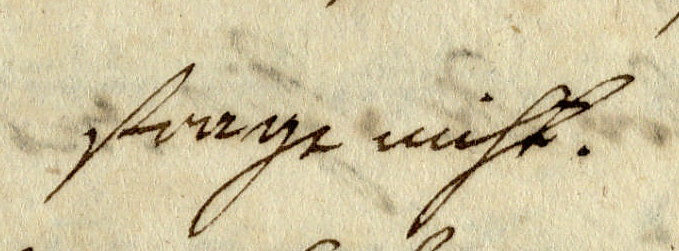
frage nicht.
